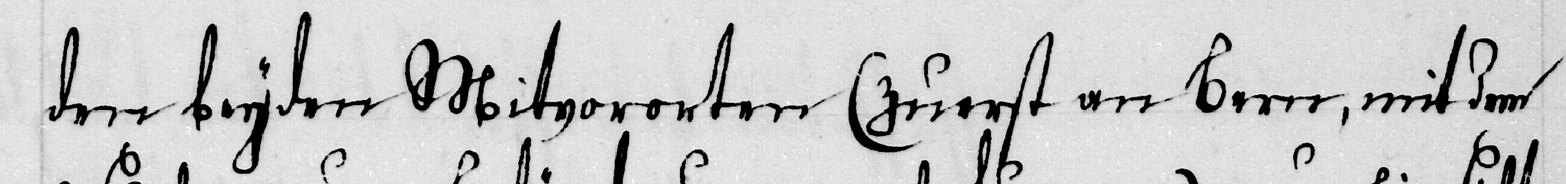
den beyden Mitvororten (zuerst an Bern, mit dem
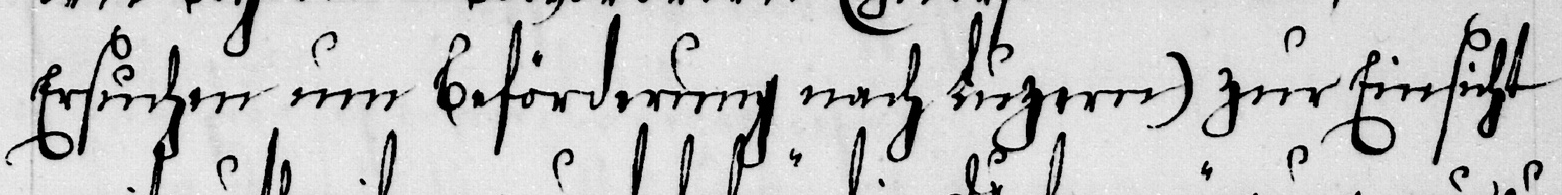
Ersuchen um Beförderung nach Luzern) zur Einsicht
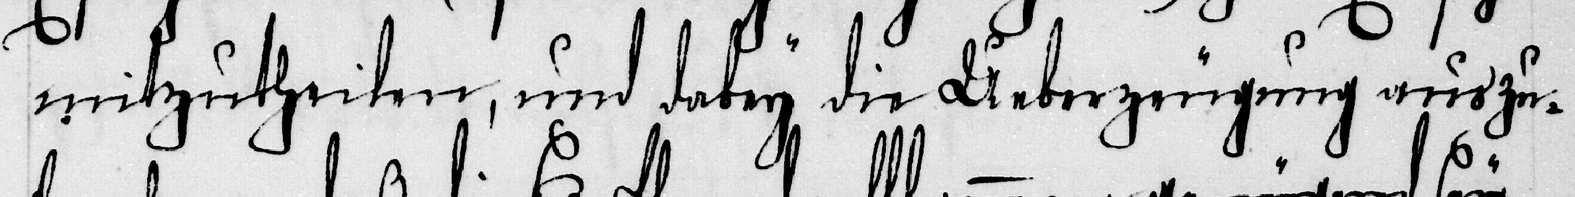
mitzutheilen, und dabey die Ueberzeugung auszu¬
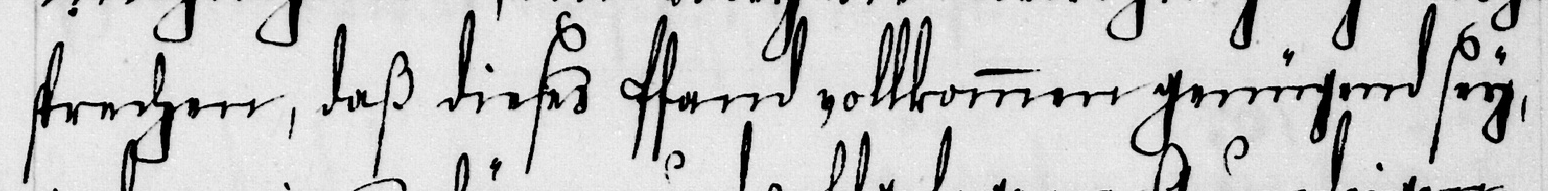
sprechen, daß dieses Pfand vollkommen genügend sey,
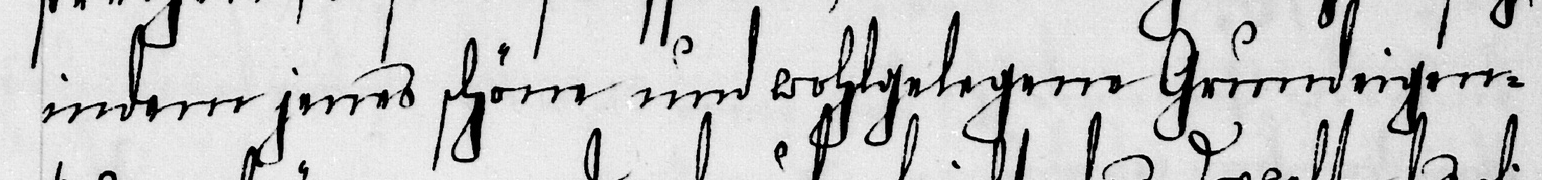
indem jenes schöne und wohlgelegene Grundeigen¬
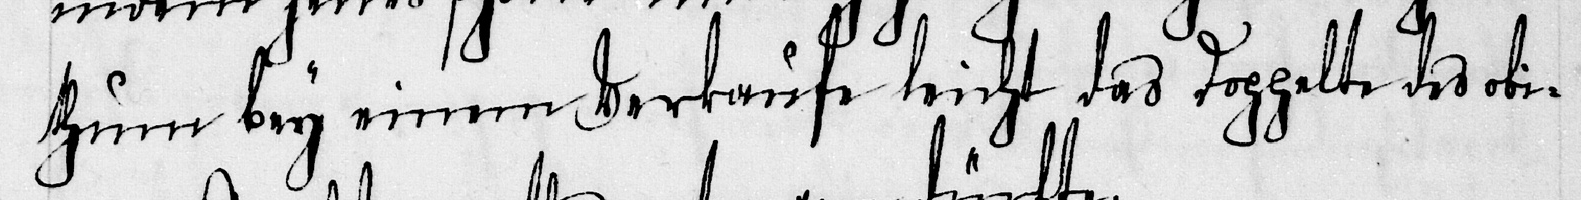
thum bey einem Verkaufe leicht das Doppelte des obi¬
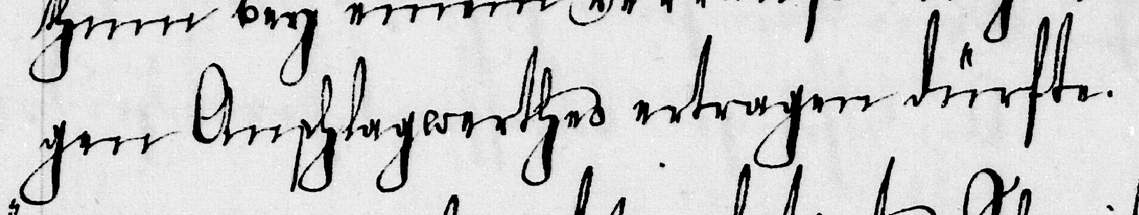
gen Anschlagwerthes ertragen dürfte.
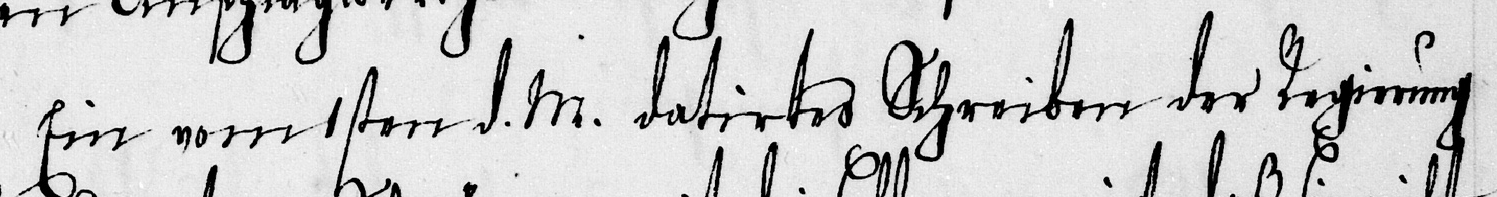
Ein vom 1sten d. M. datirtes Schreiben der Regierung
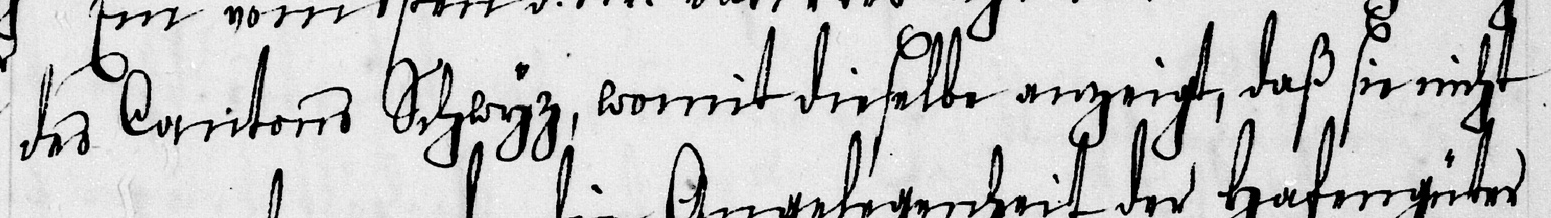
des Cantons Schwyz, womit dieselbe anzeigt, daß sie nicht
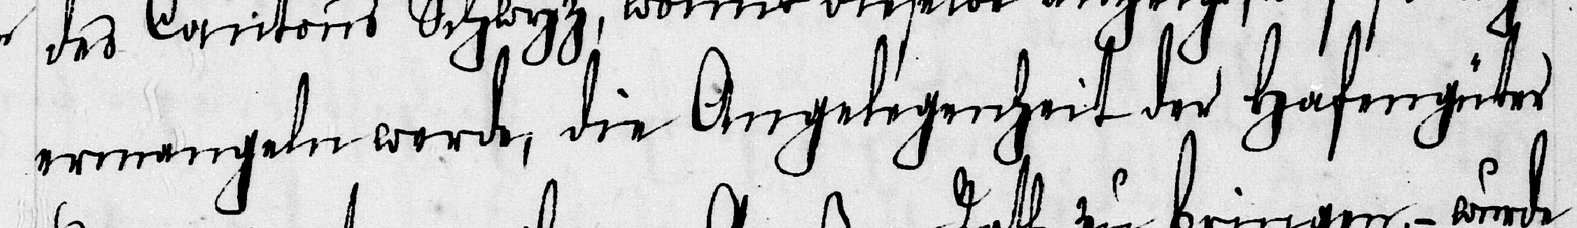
ermangeln werde, die Angelegenheit der Hafengüter
